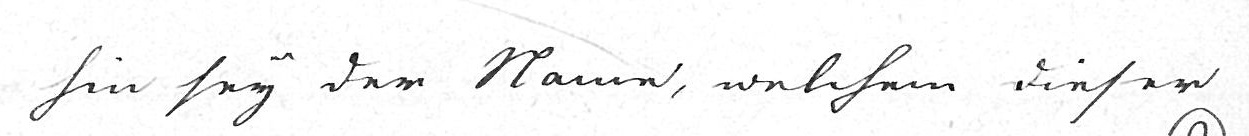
hin sey der Name, welchem dieser
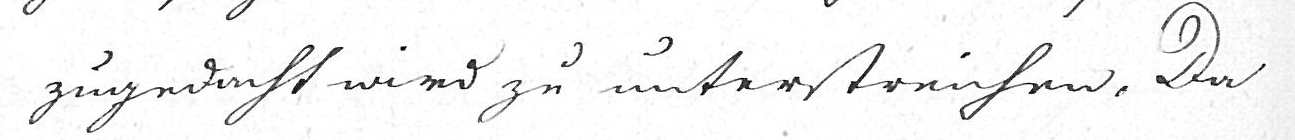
zugedacht wird zu unterstreichen. Da
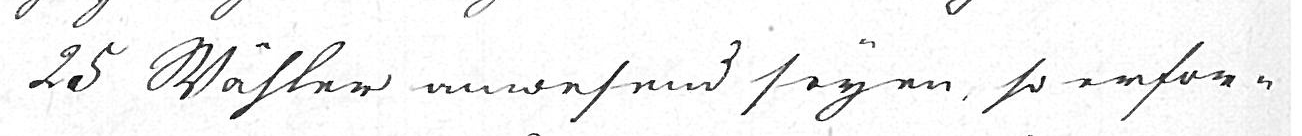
25 Wähler anwesend seyen, so erfor-
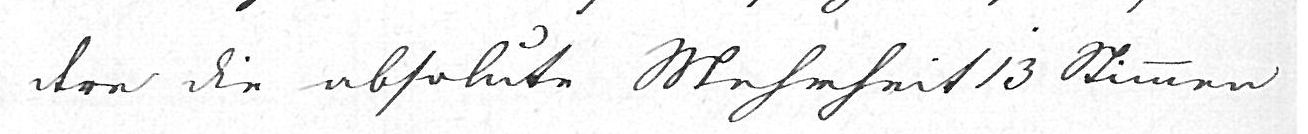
dere die absolute Mehrheit 13 Stimmen.
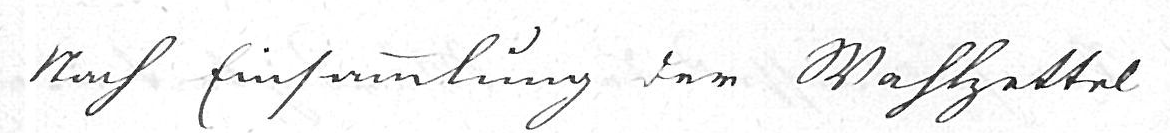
Nach Einsammlung der Wahlzettel
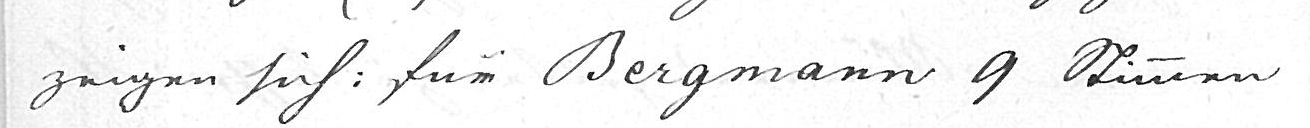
zeigen sich für Bergmann 9 Stimmen
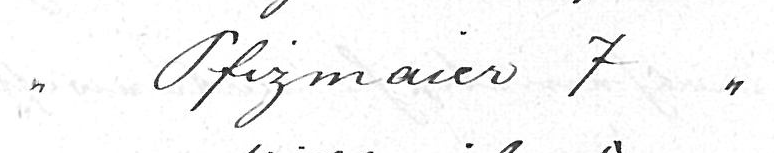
" Pfizmaier 7 "
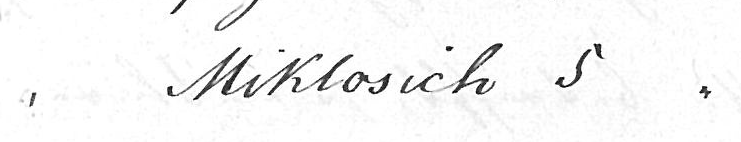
" Miklosich 5 "
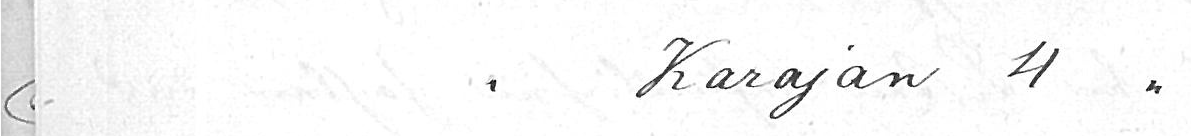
" Karajan 4 "
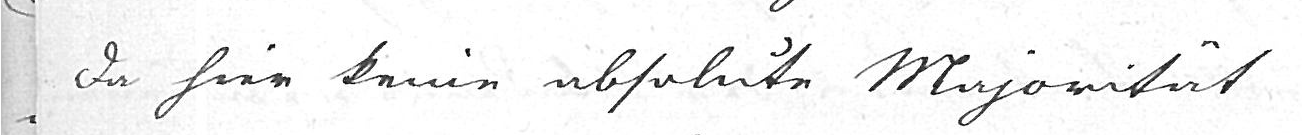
Da hier keine absolute Majorität
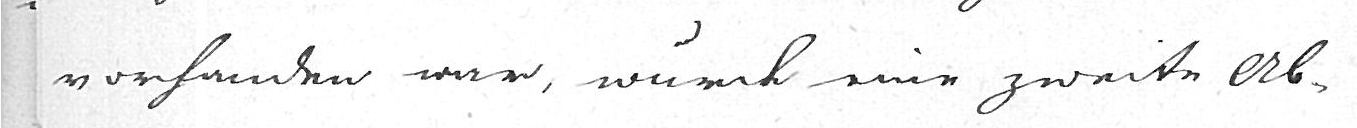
vorhanden war, wurde eine zweite Ab-
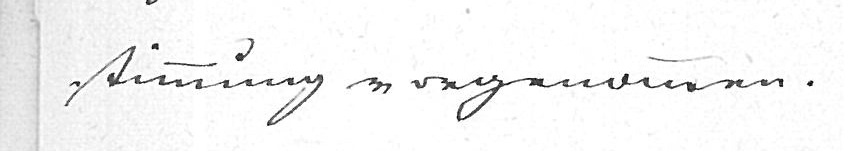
stimmung vorgenommen.
